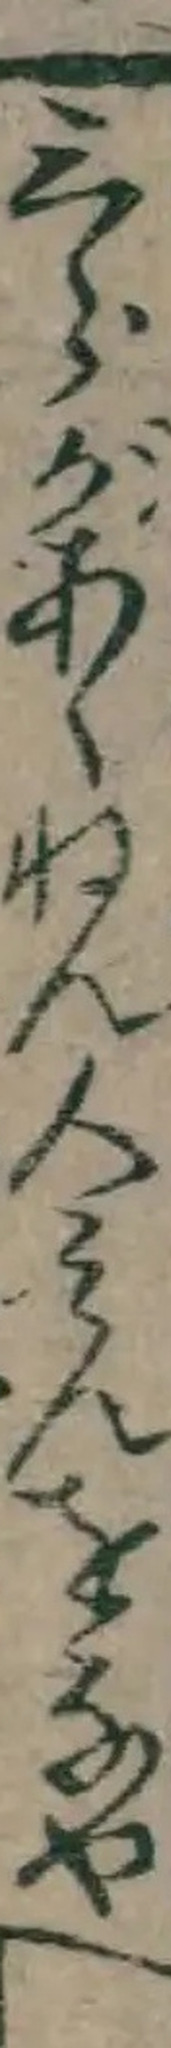三郎があくねん人みんをなや
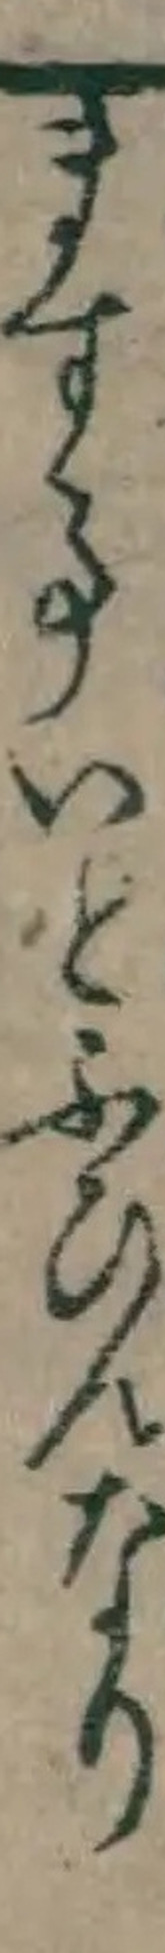ます事いとふひんなり
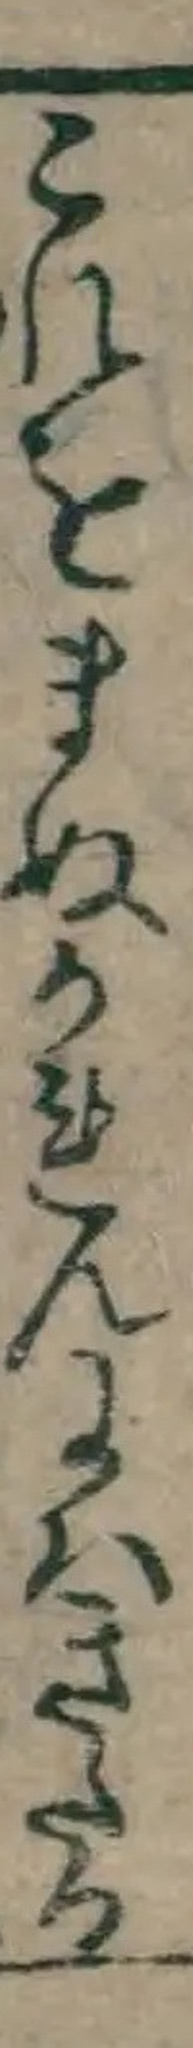これをまぬかれんにはきたる
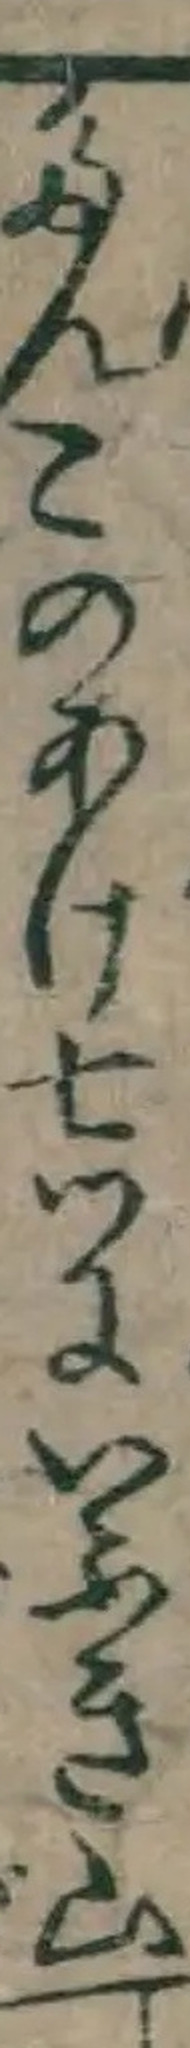たんこのあけ七ツにいふき山
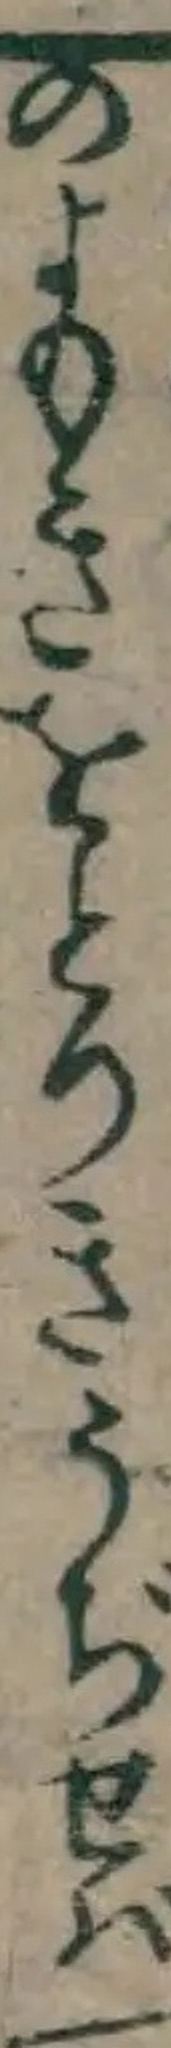のよもきをとりきうぢせば
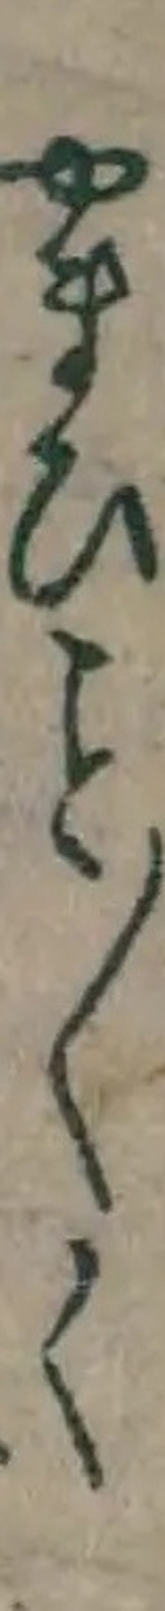やまひこと〳〵く
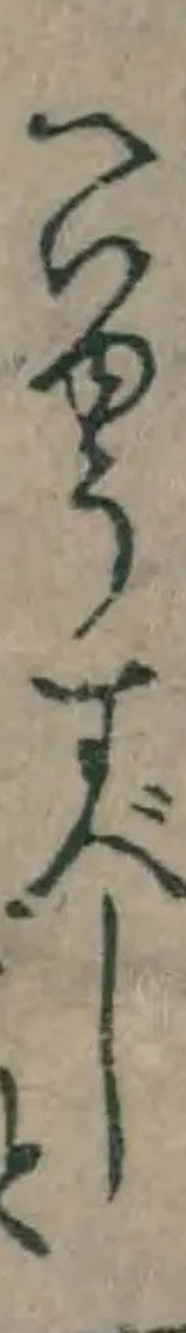へいゆうすべしと
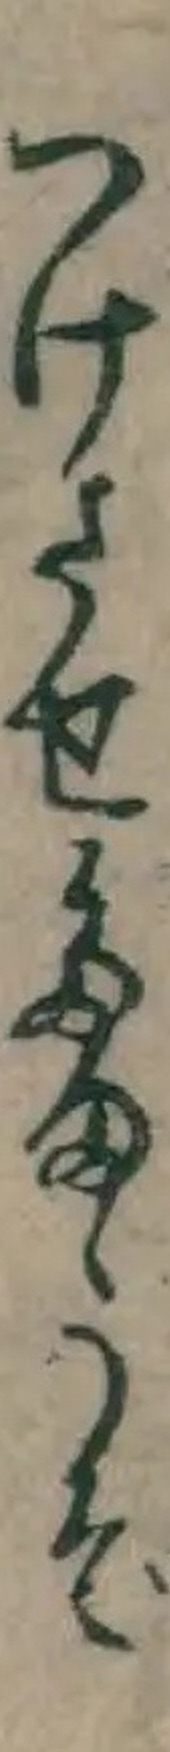つけさせたまうぞ
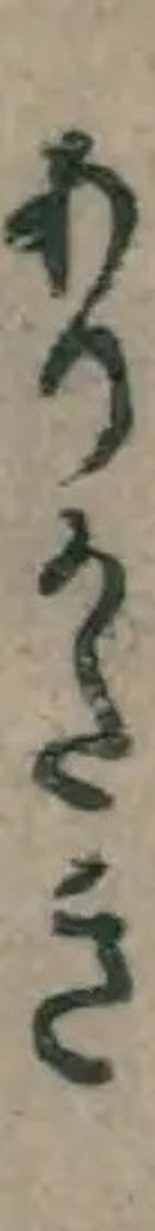ありがたき

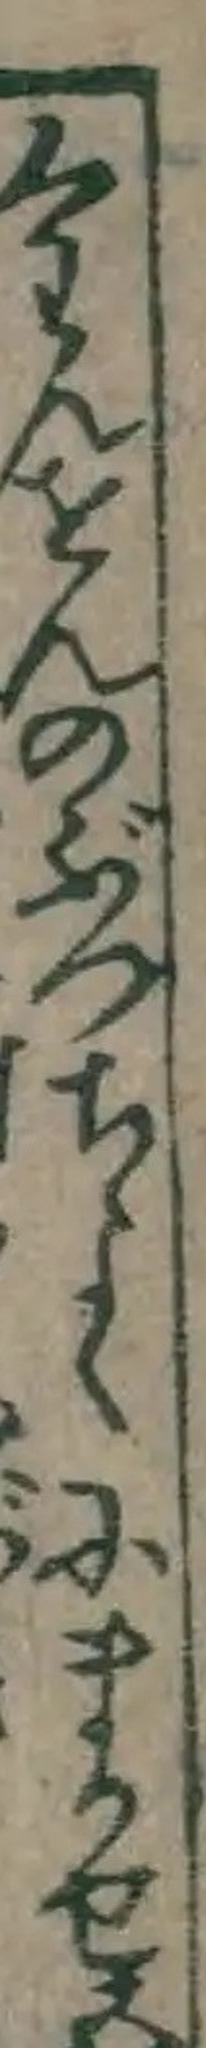くわんをんのぶつちよくにまかせ五月
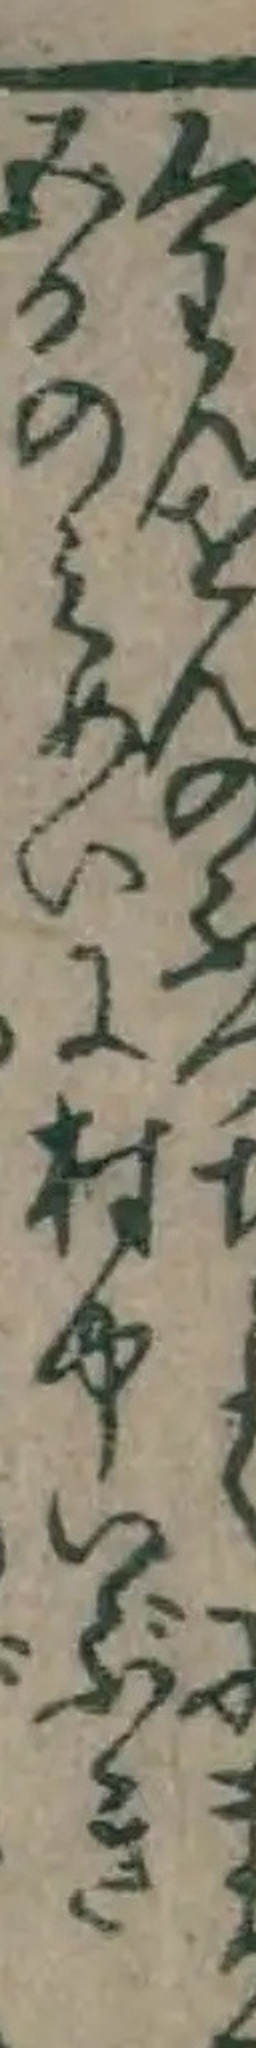五日のみめいに村中いぶき
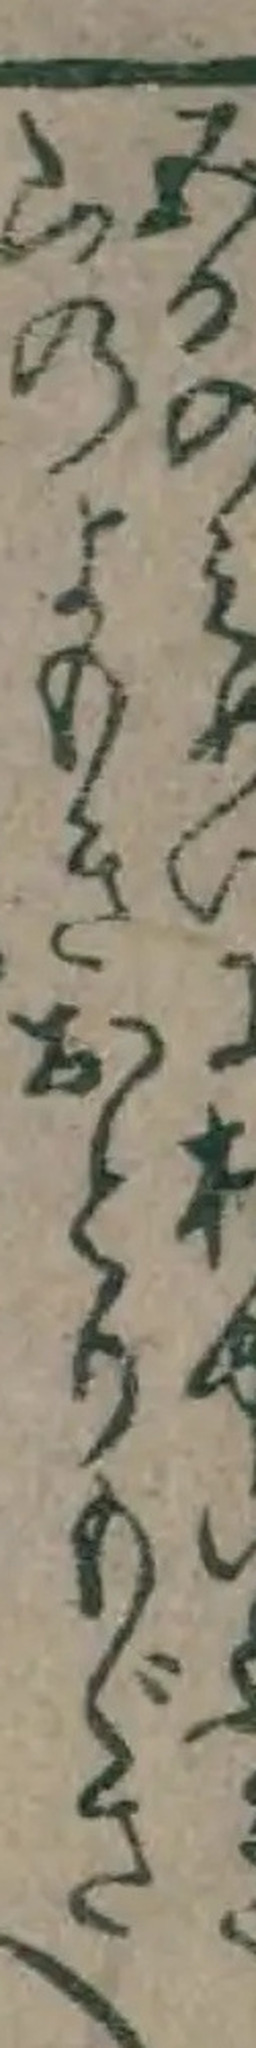山のよもきおとりもぐさ
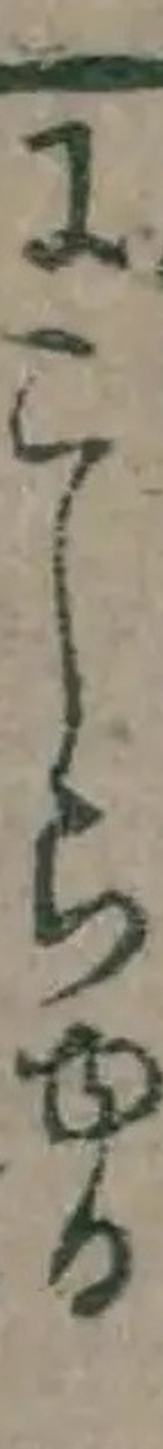にこしらゆる
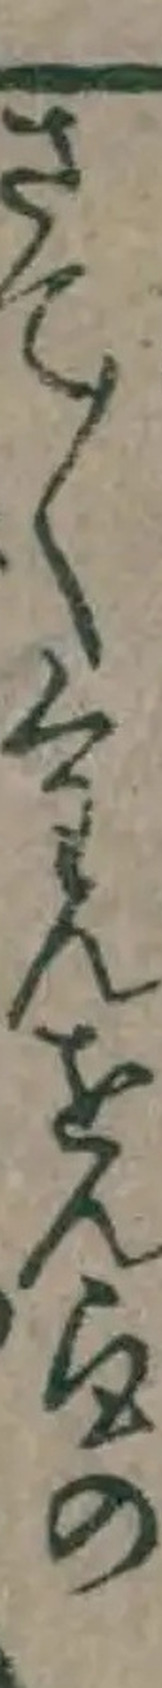さて〳〵くわんをんさまの
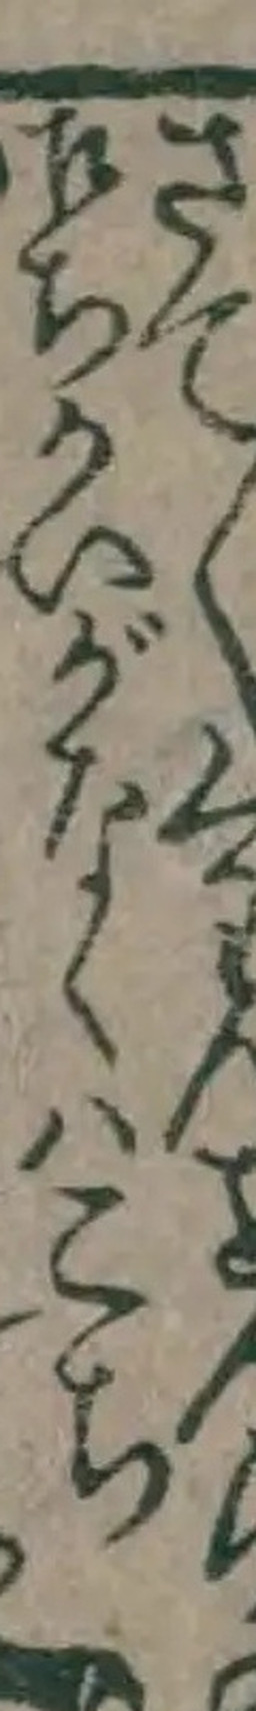御ちかいがなくはこち
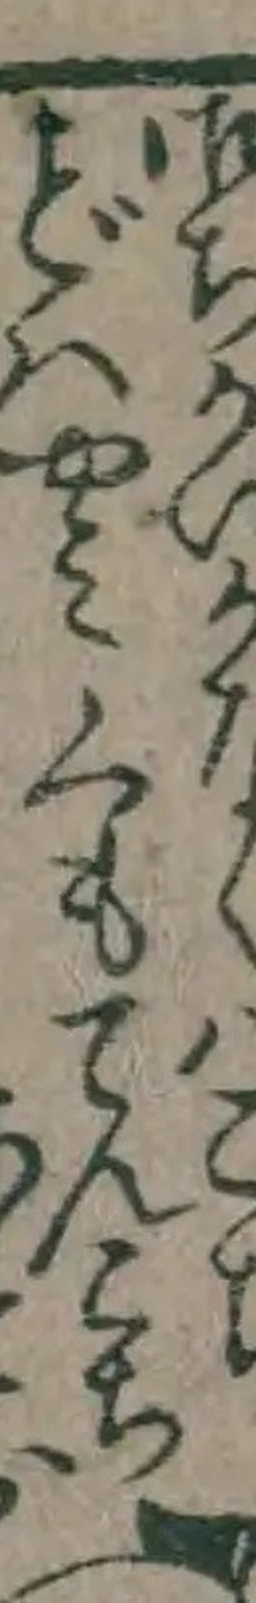ごとはやみくもてんこち
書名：団十郎蓬芥伝
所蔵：国立国会図書館 National Diet Library, JAPAN
